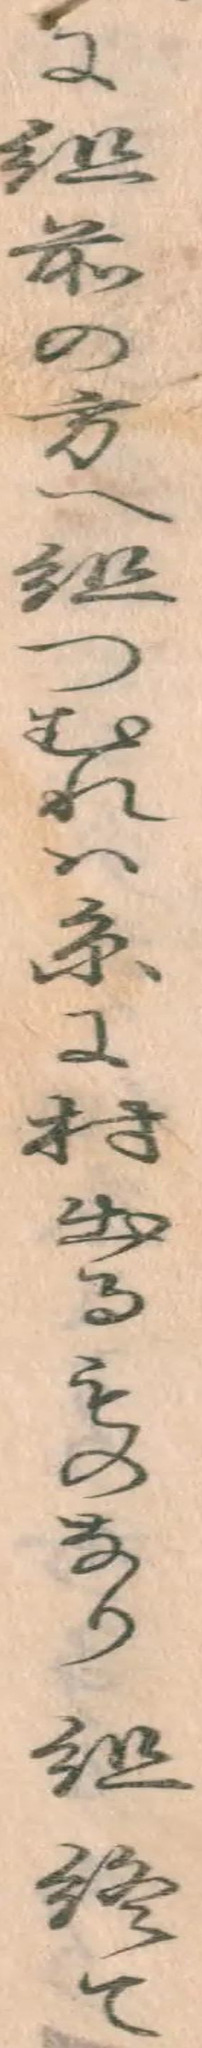に組前の方へ組つむれは糸に村出るものなり組終て
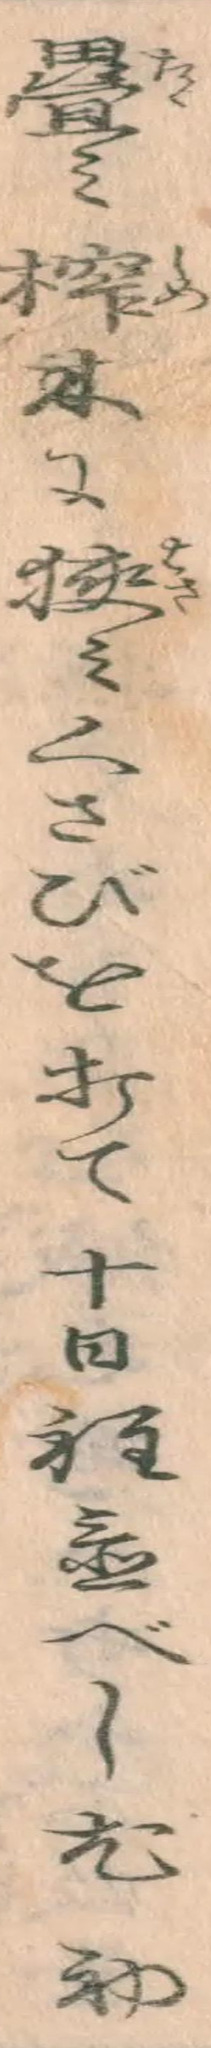畳み搾木に挟みくさびを打て十日程置べし尤初
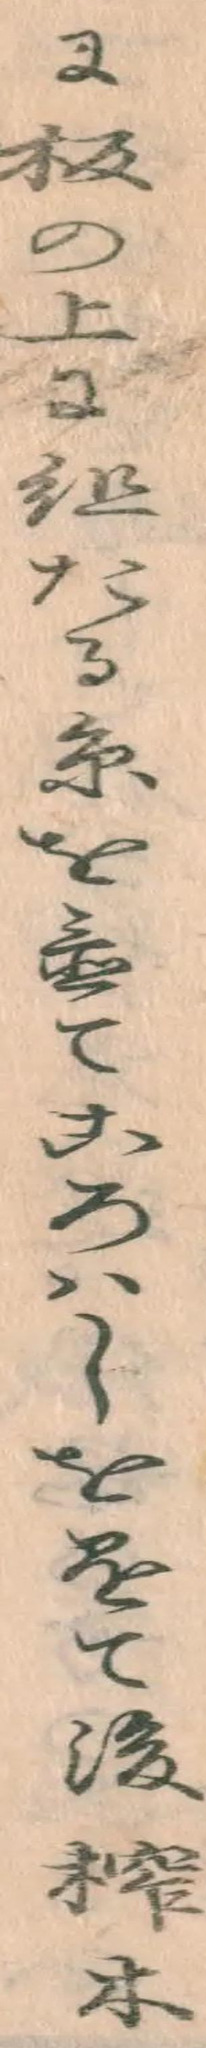に板の上に組たる糸を置てころはしを懸て後搾木
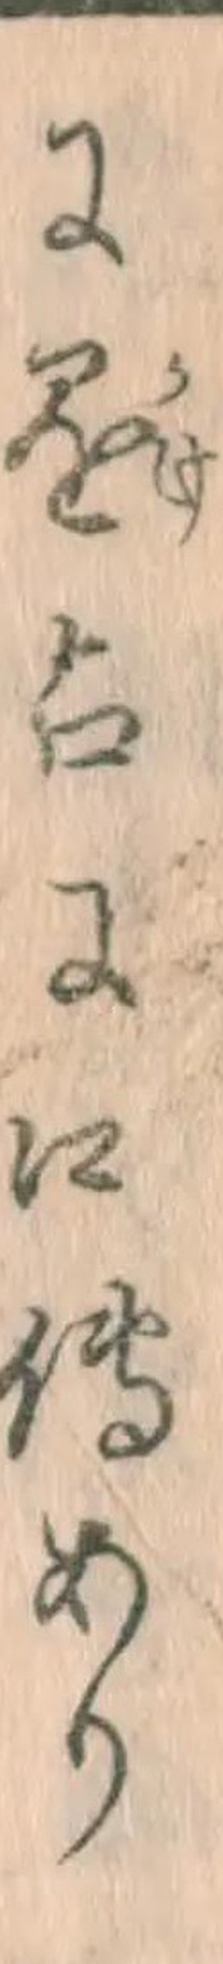に懸占に口伝あり
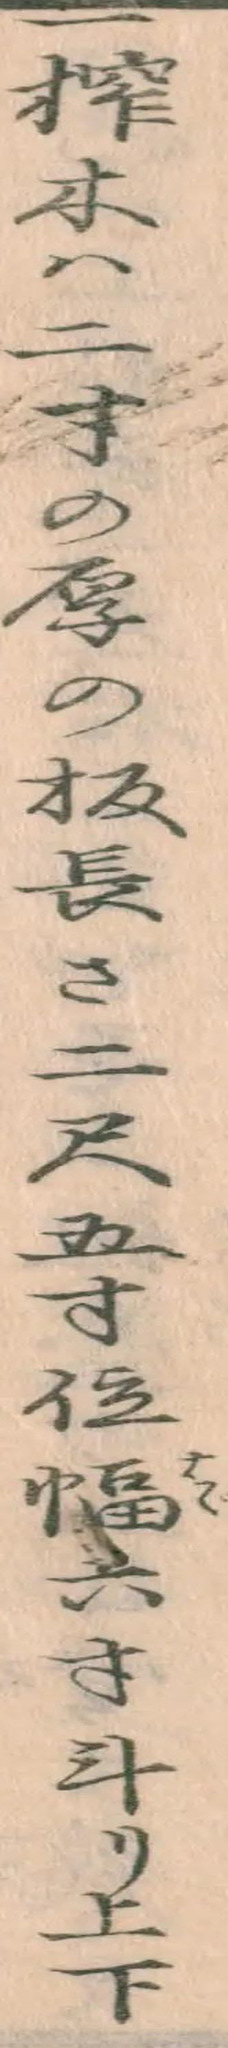一搾木は二寸の厚の板長さ二尺五寸位幅六寸計り上下
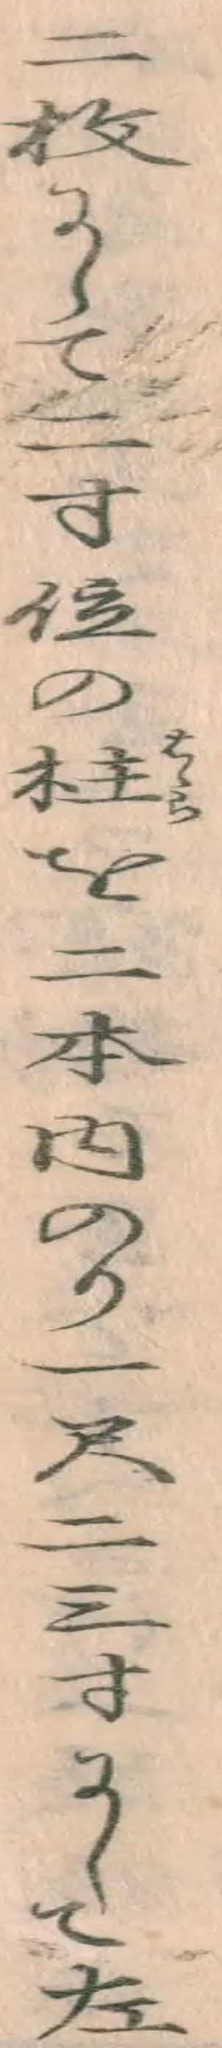二枚にして二寸位の柱を二本内のり一尺二三寸にして左
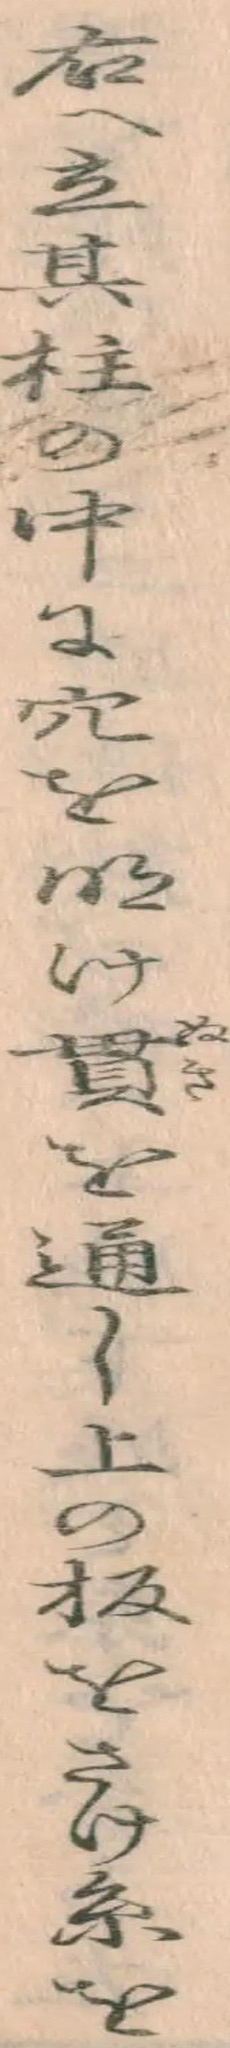右へ立其柱の中に穴を明け貫を通し上の板をさけ糸を
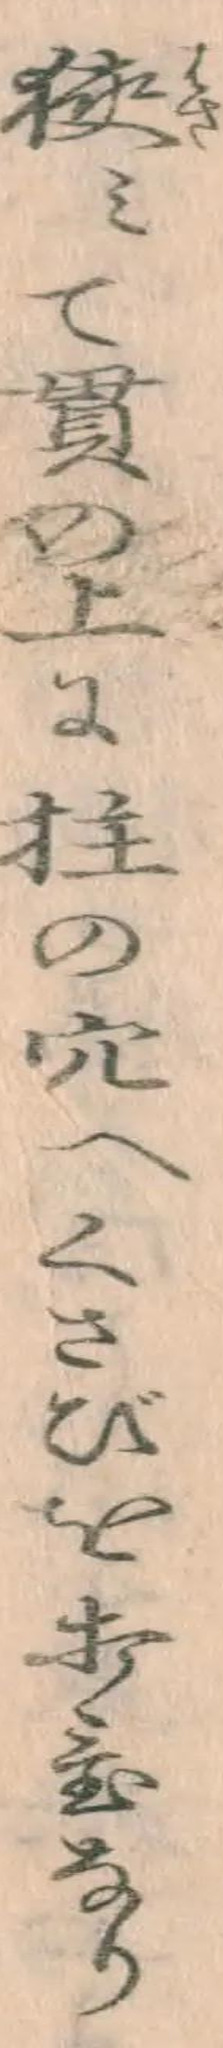挟みて貫の上に柱の穴へくさびを打置なり
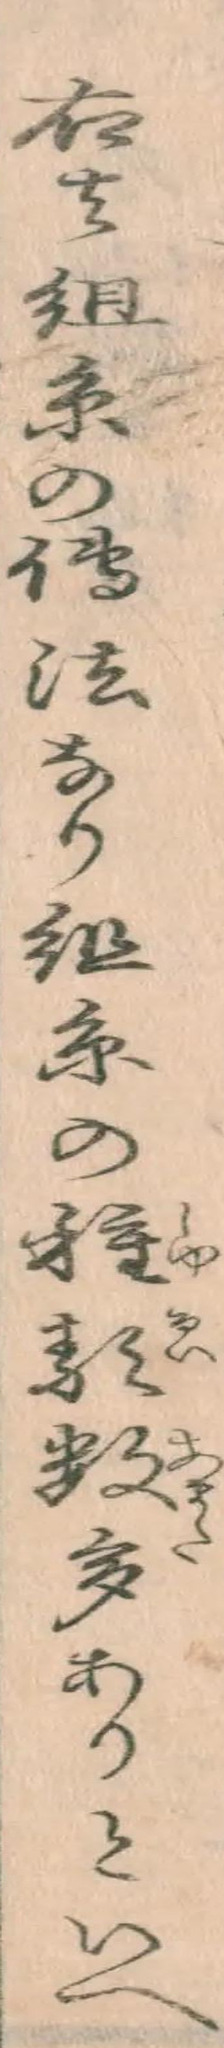右は組糸の伝法なり組糸の種類数多ありといへ
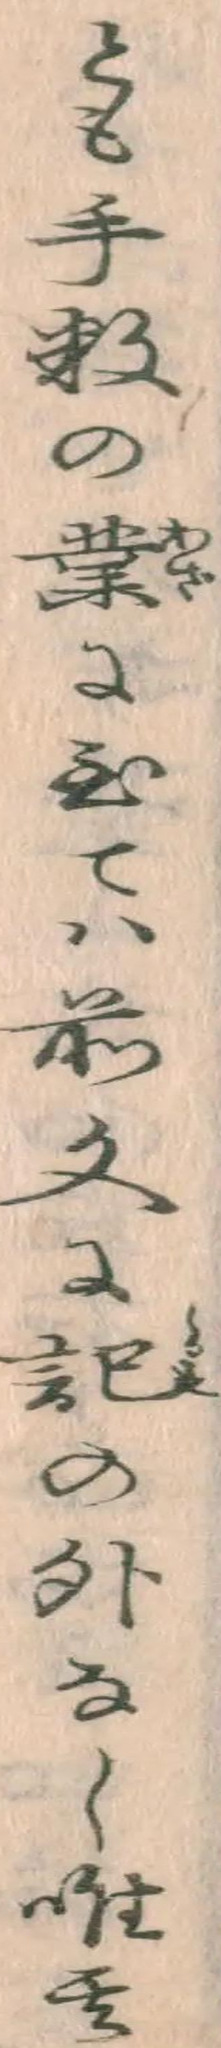とも手数の業に至ては前文に記の外なし唯其
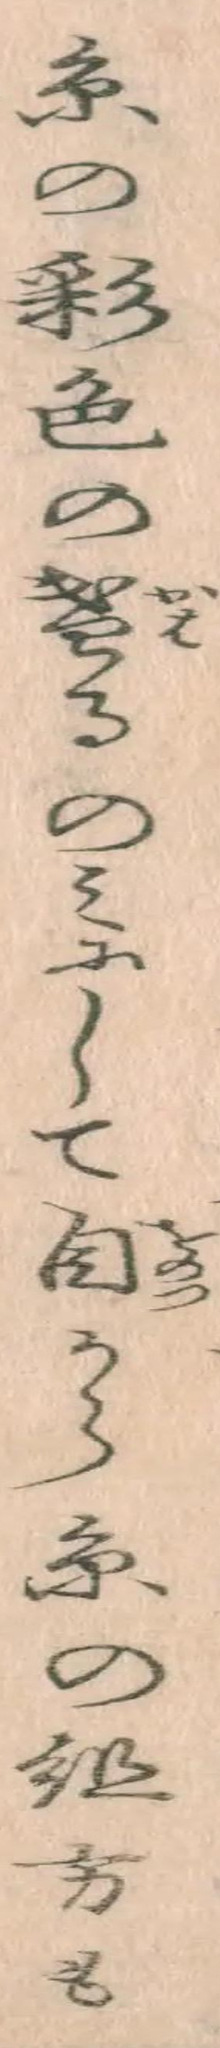糸の彩色の替るのみにして自から糸の組方も
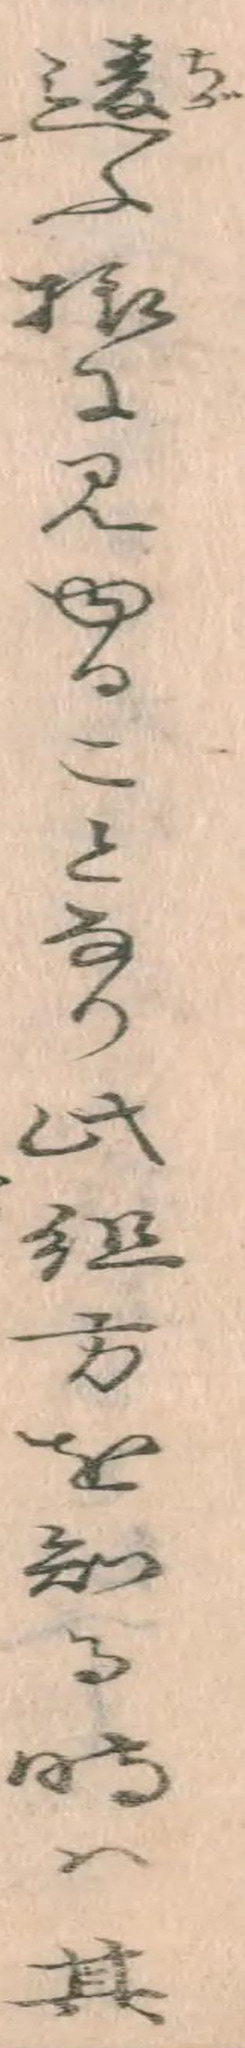違ふ様に見ゆることなり此組方を知る時は其
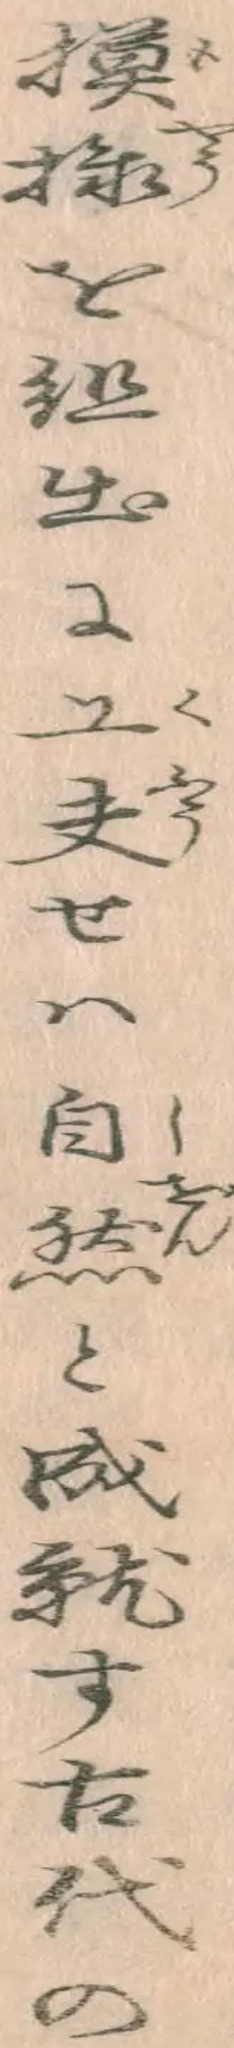模様を組出に工夫せは自然と成就す古代の
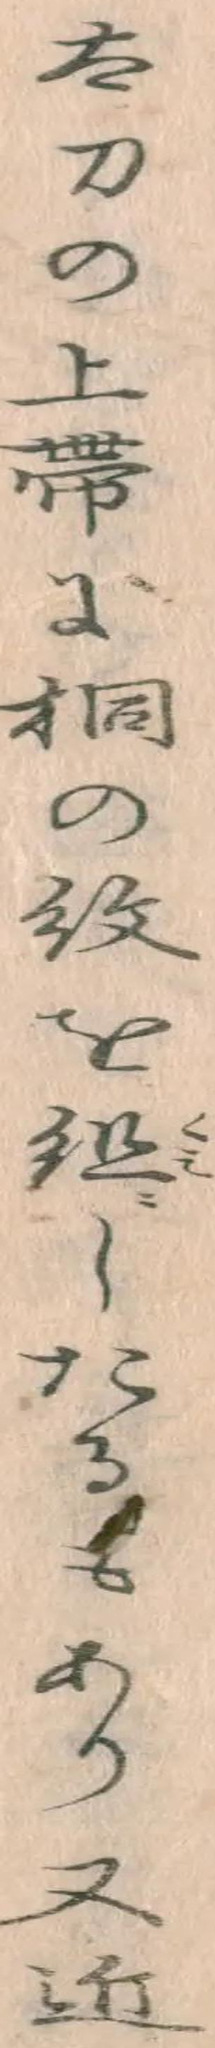太刀の上帯に桐の紋を組にしたるもあり又近
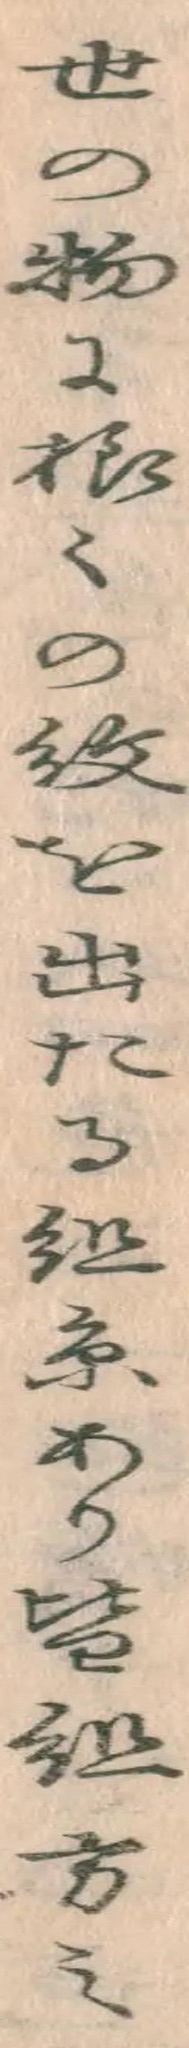世の物に様々の紋を出たる組糸あり皆組方之
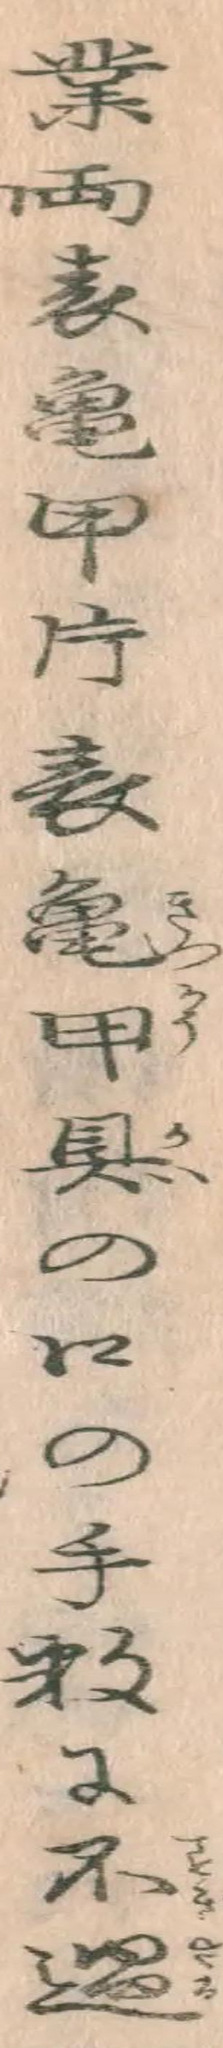業両表亀甲片表亀甲貝の口の手数に不過
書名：機織彙編 5巻. [2]
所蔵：国立国会図書館 National Diet Library, JAPAN
